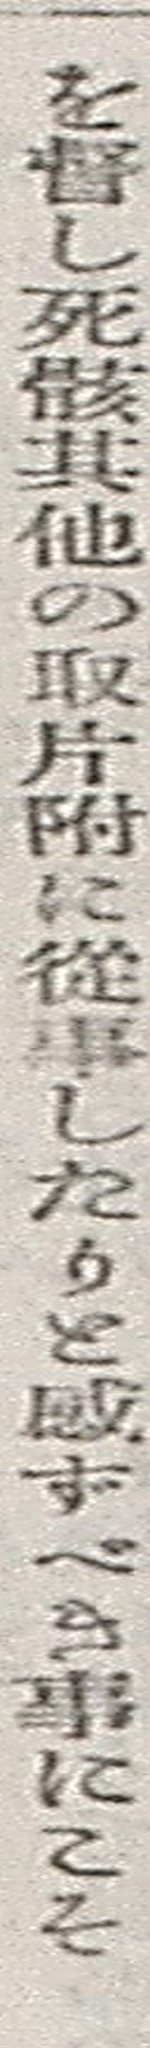を督し死骸其他の取片付に従事したりと感ずべき事にこそ
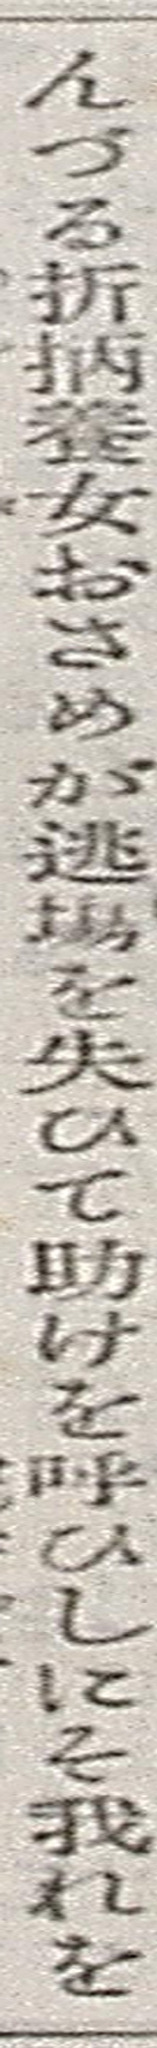んづる折柄養女おさめが逃場を失ひて助けを呼ひしにそ我れを
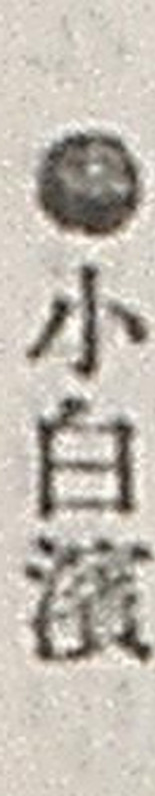●小白浜
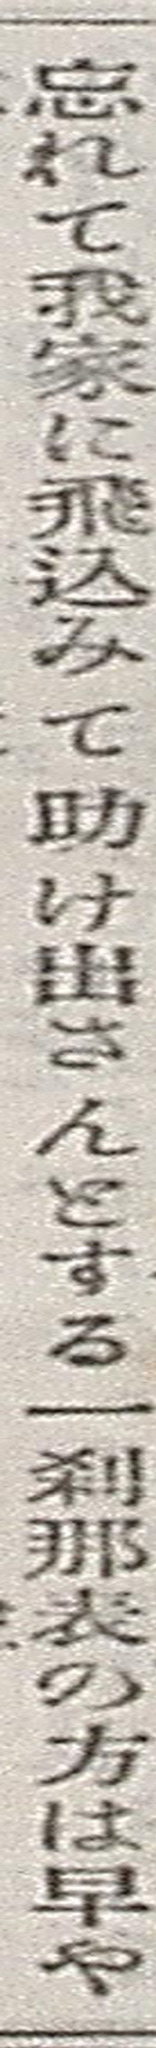忘れて我家に飛込みて助け出さんとする一刹那表の方は早や
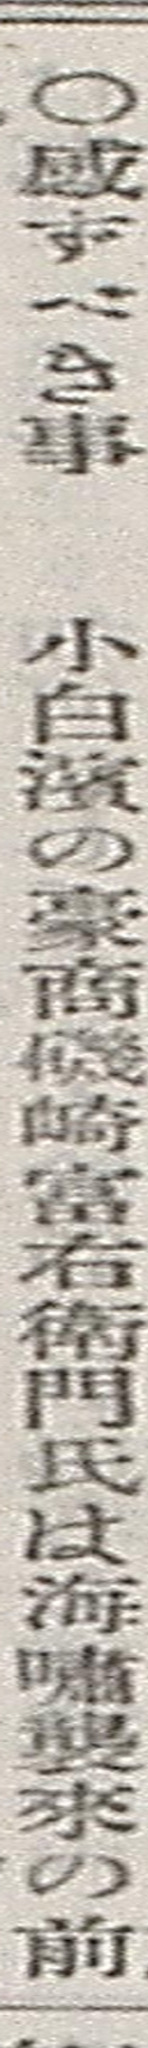○感ずべき事小白浜の豪商磯崎冨右衛門氏は海嘯襲来の前
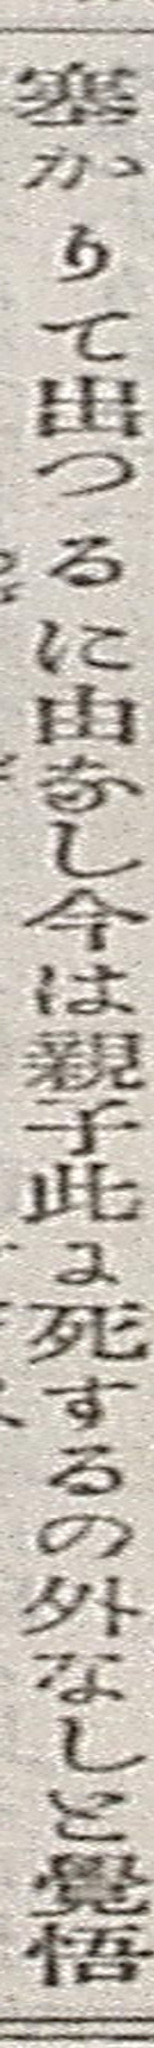塞かりて出つるに由なし今は親子此に死するの外なしと覚悟
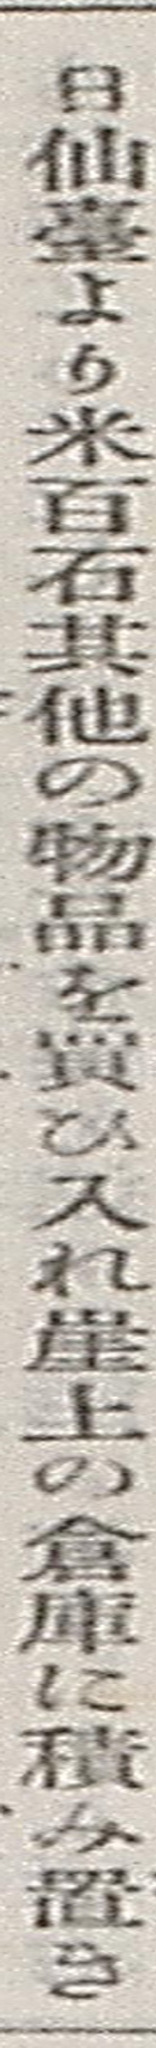日仙台より米百石其他の物品を買ひ入れ崖上の倉庫に積み置き
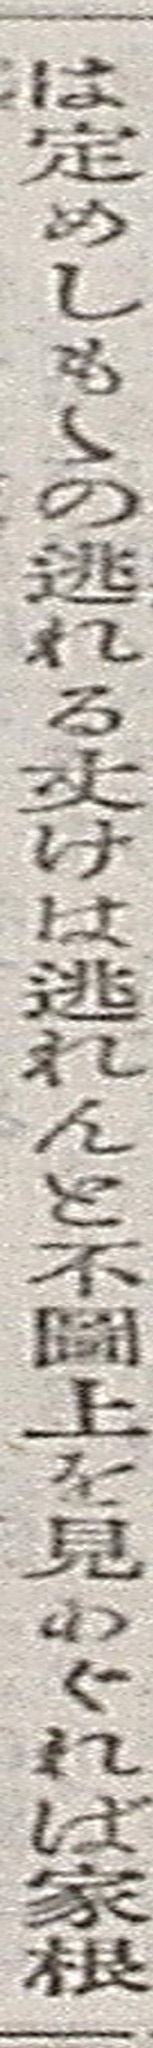は定めしもゝの逃れる丈けは逃れんと不図上を見あぐれば家根
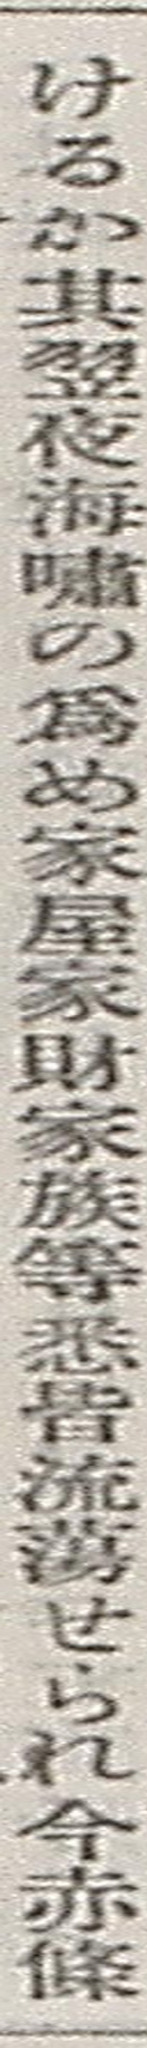けるか其翌夜海嘯の為め家屋家財家族等悉皆流蕩せられ今赤条
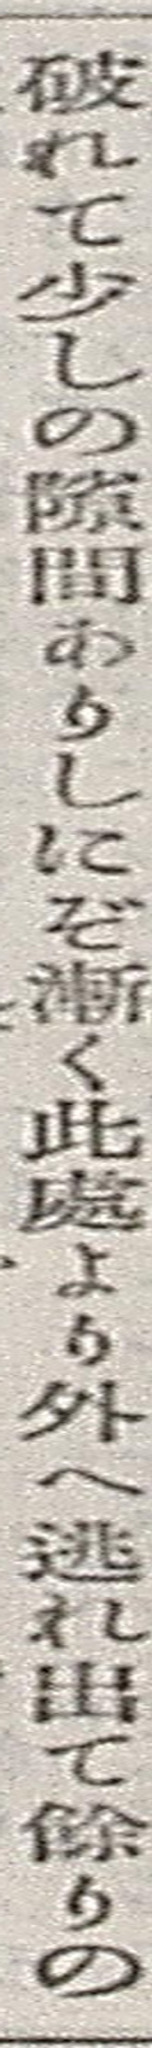破れて少しの隙間ありしにぞ漸く此処より外へ逃れ出て余りの
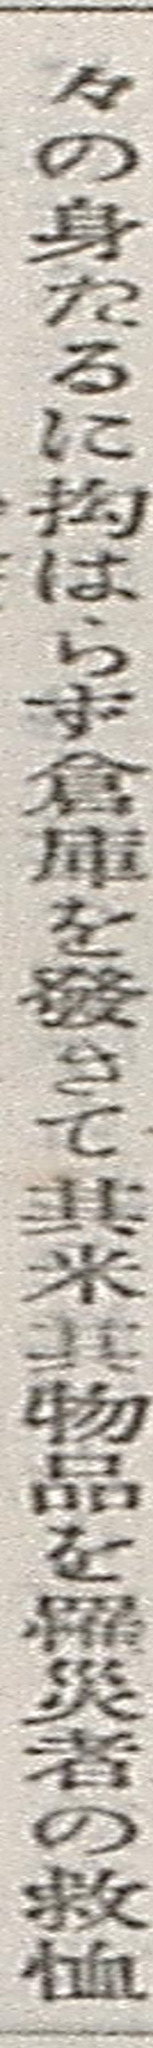々の身たるに拘はらず倉庫を発きて其米其物品を罹災者の救恤
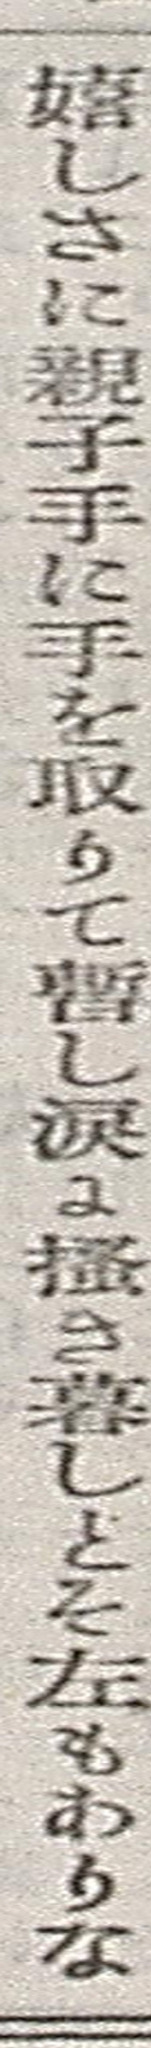嬉しさに親子手に手を取りて暫し涙に掻き暮しとそ左もありな
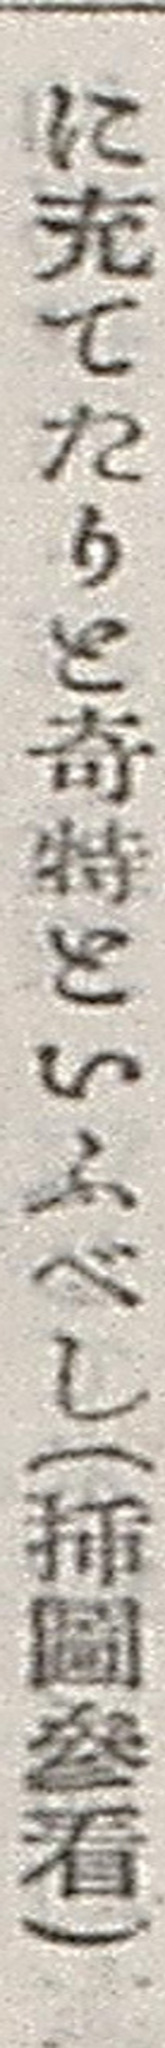に充てたりと奇特といふべし
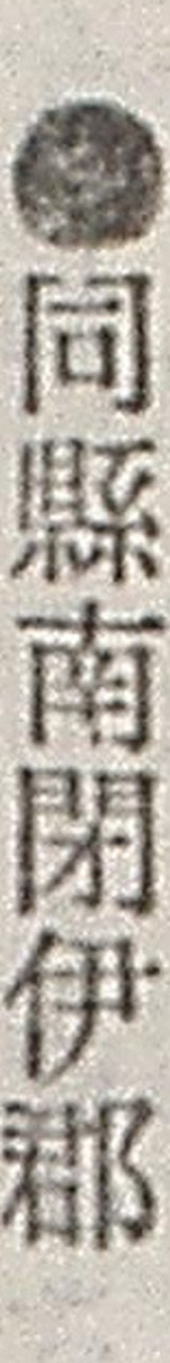●同県南閉伊郡
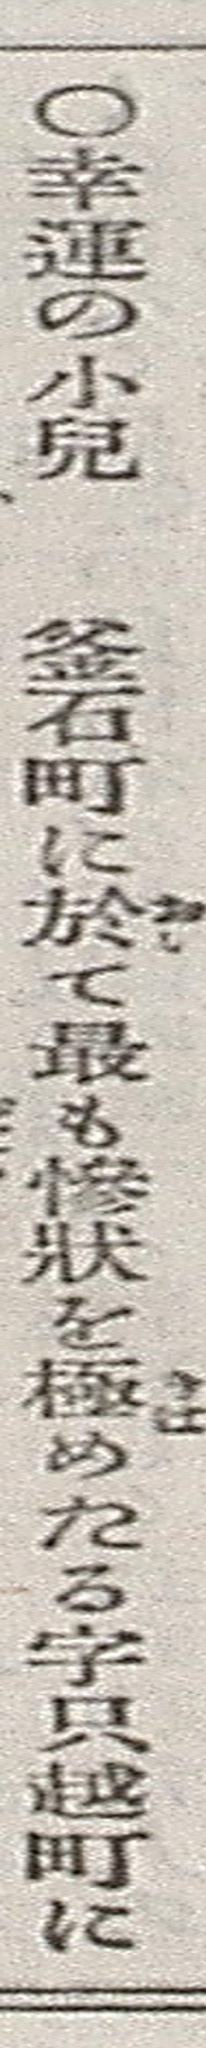○幸運の小兒釜石町に於て最も惨状を極めたる字只越町に
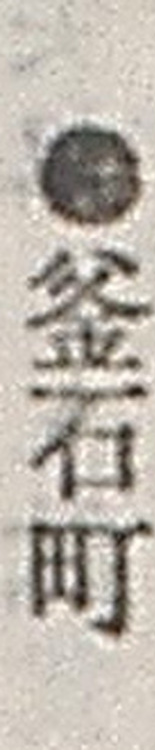●釜石町
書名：風俗畫報臨時増刊第百二十號　大海嘯被害録（下）
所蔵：東京大学地震研究所図書室 Earthquake Research Institute Library, The University of Tokyo, JAPAN
